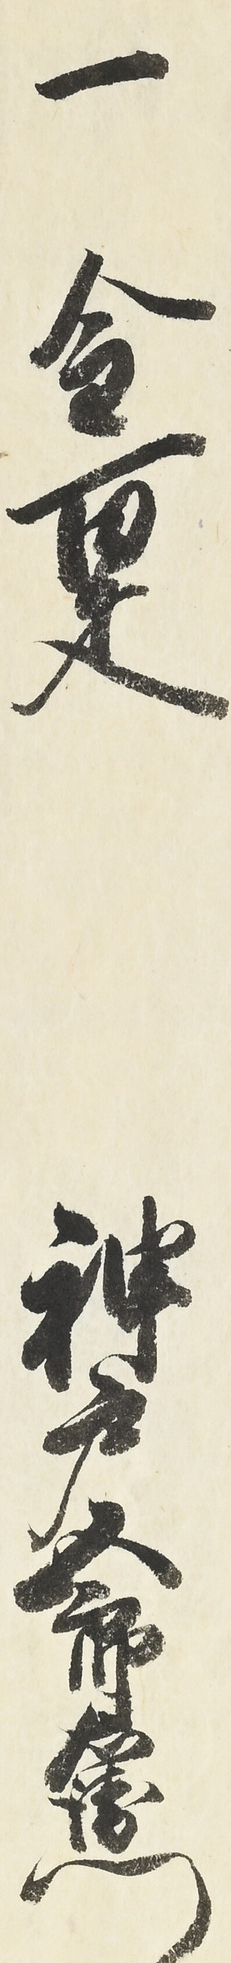一金百疋神戸五郎右衛門
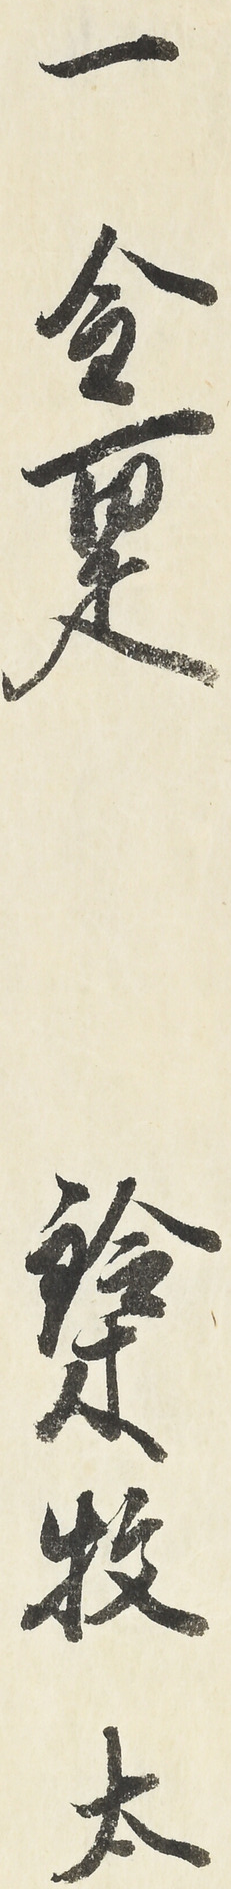一金百疋鈴木牧太

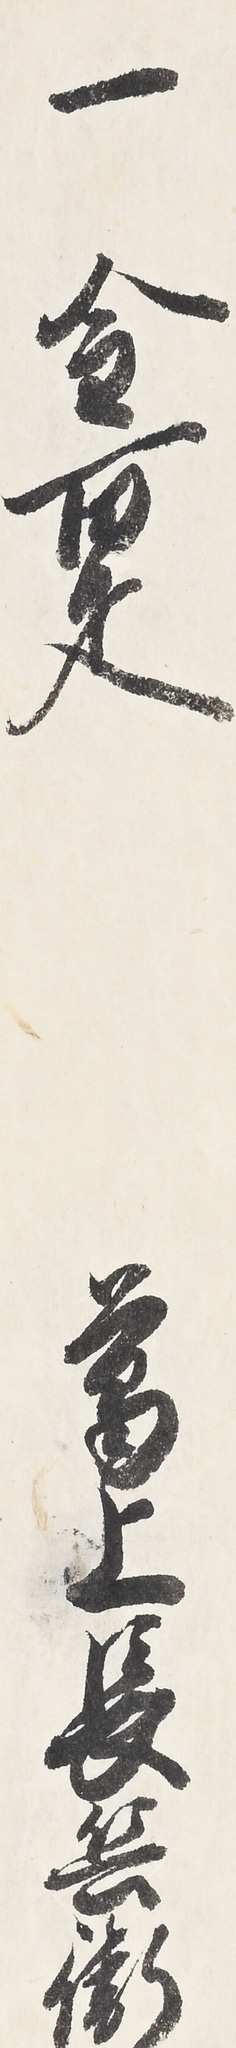一金百疋葛上長兵衛
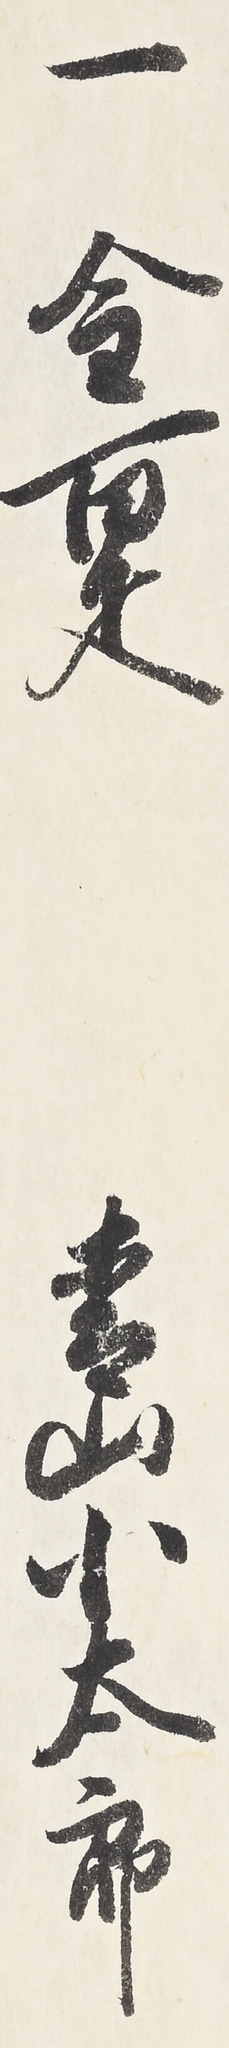一金百疋青山小太郎
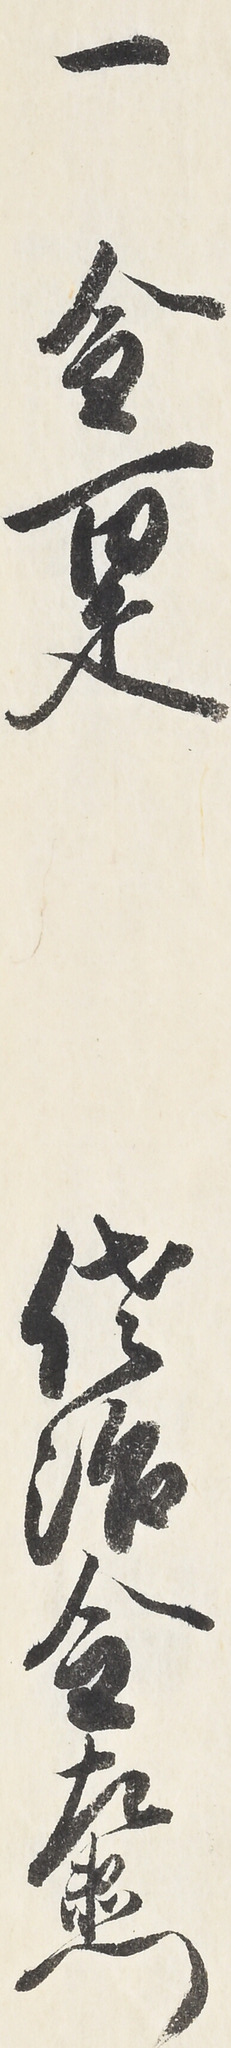一金百疋佐治金左衛門
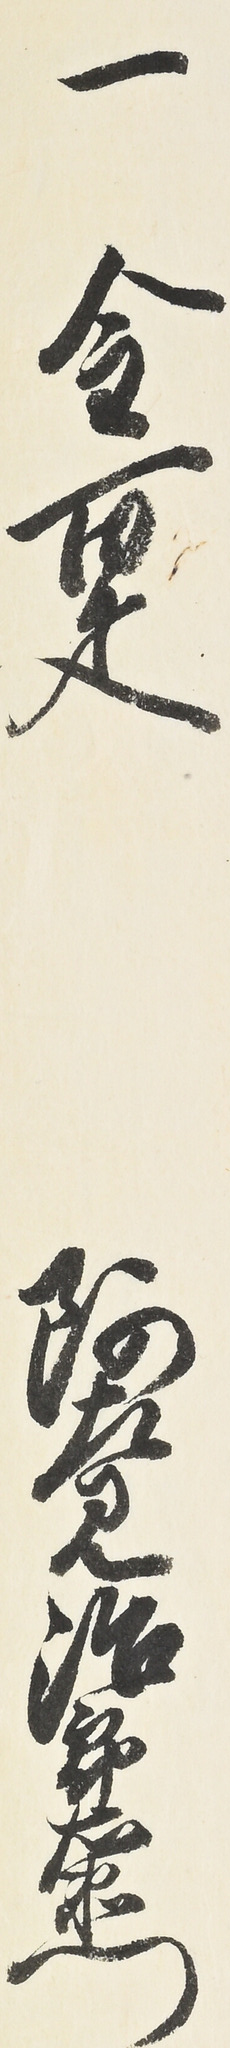一金百疋阿左見治郎右衛門
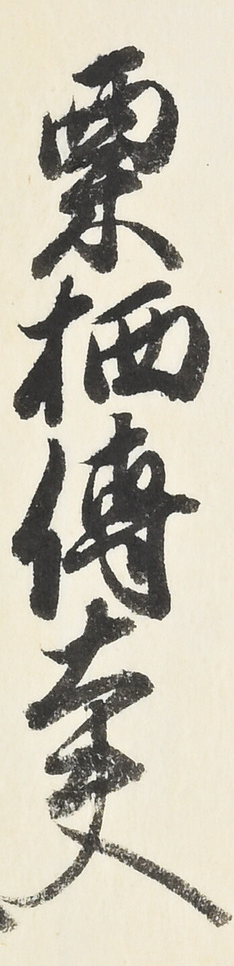栗栖伝大夫
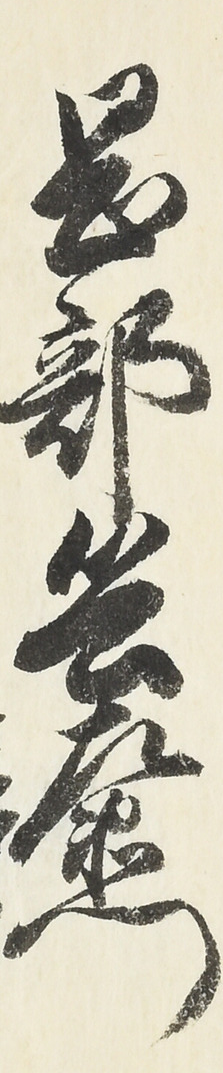岡部兵左衛門
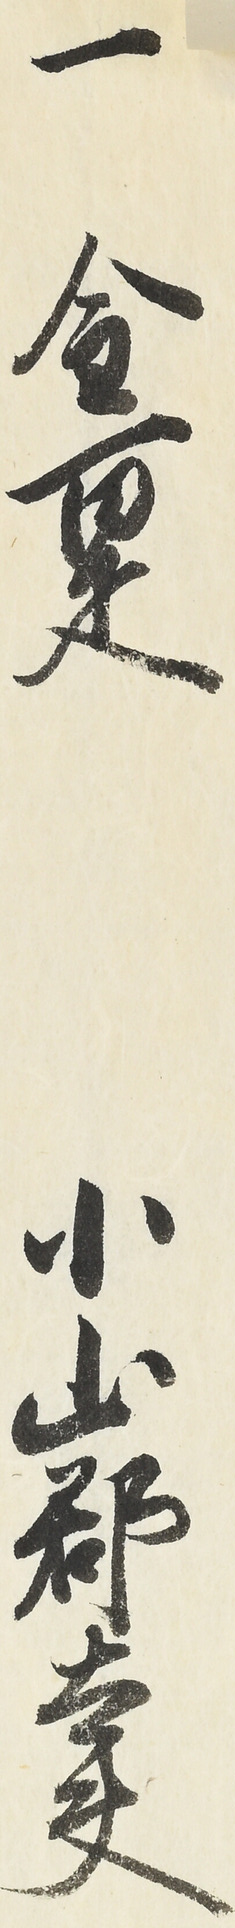一金百疋小山郡太夫

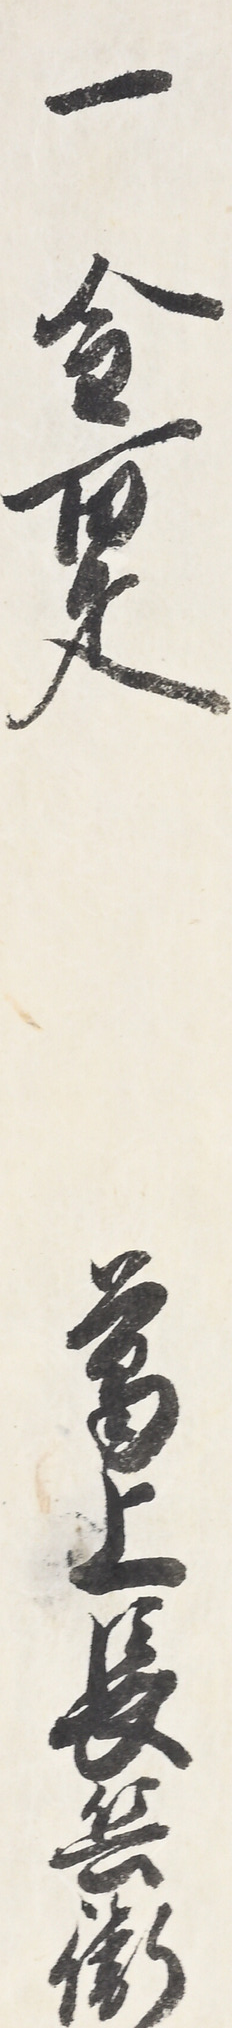一金百疋葛上長兵衛
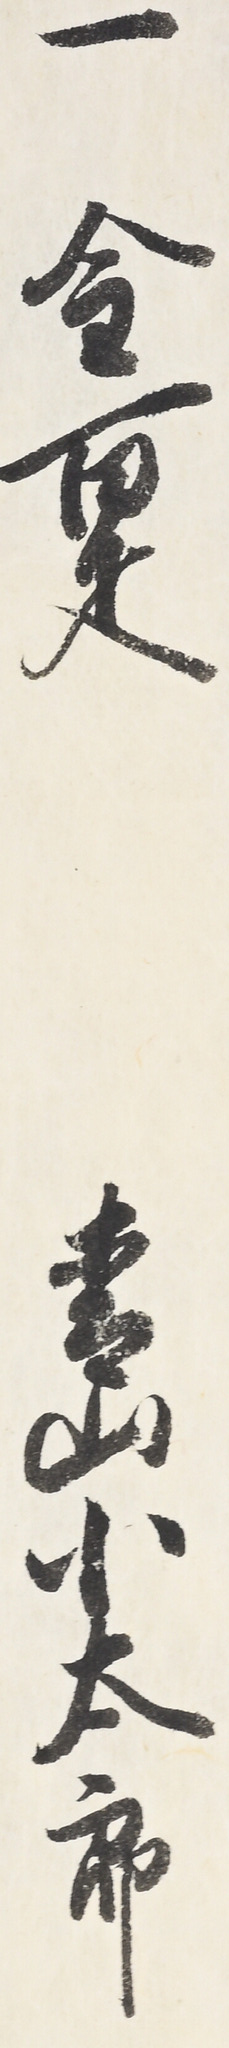一金百疋青山小太郎
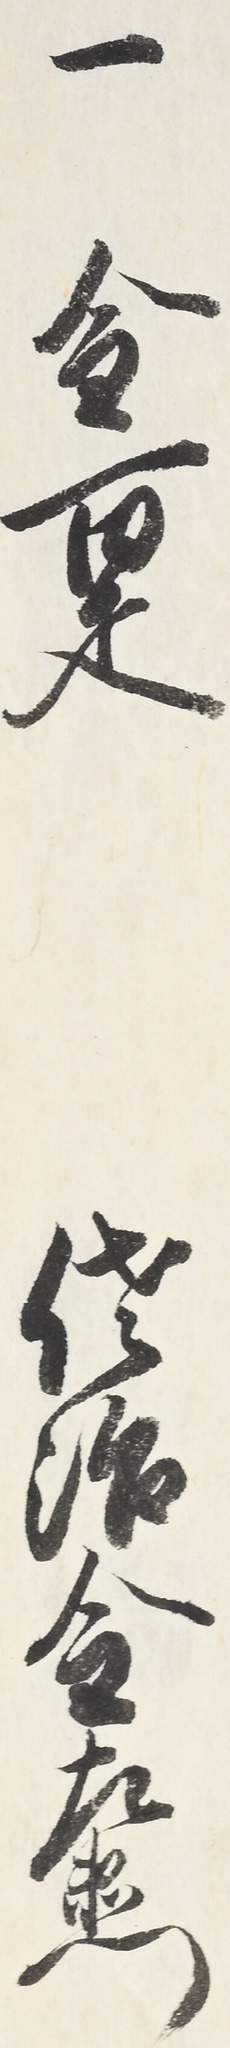一金百疋佐治金左衛門
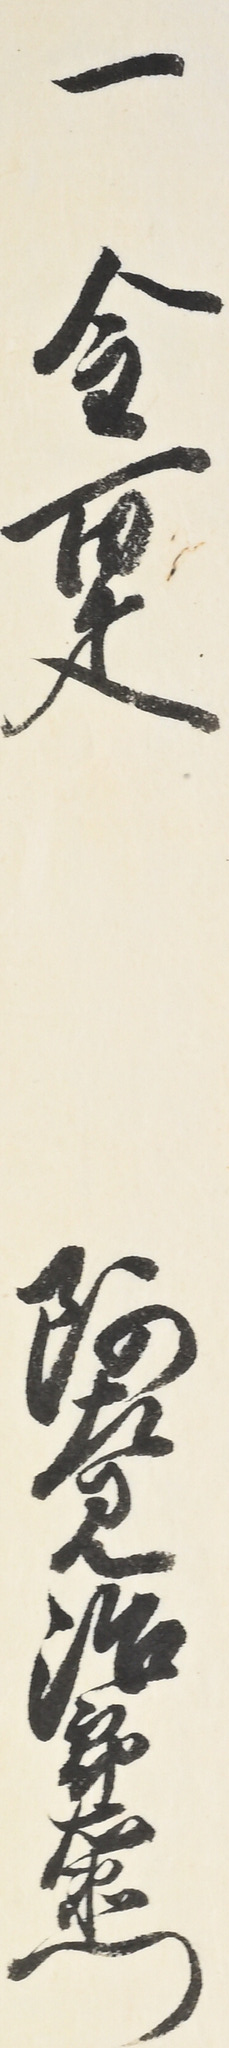一金百疋阿左見治郎右衛門
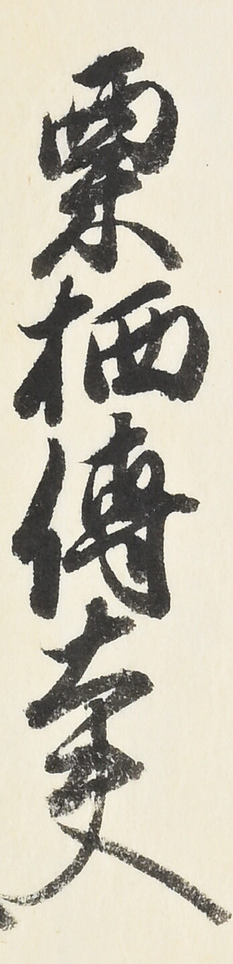栗栖伝大夫
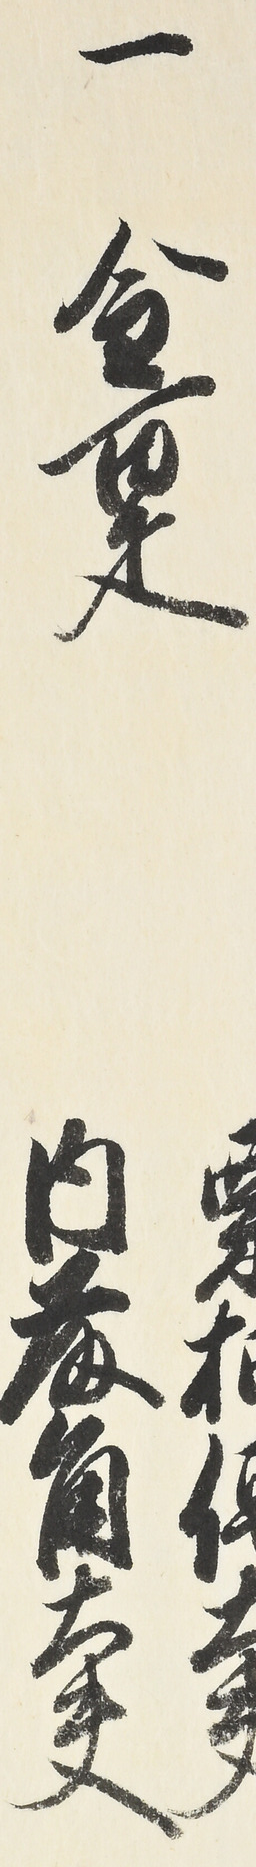一金百疋内藤角大夫
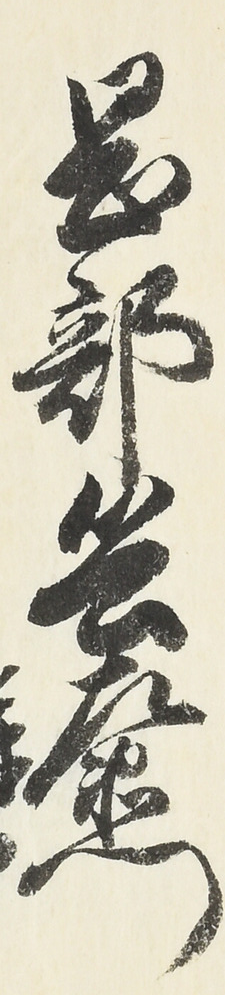岡部兵左衛門
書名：永代太々御神楽名前帳
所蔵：伊那市立高遠町図書館・合同会社AMANE
